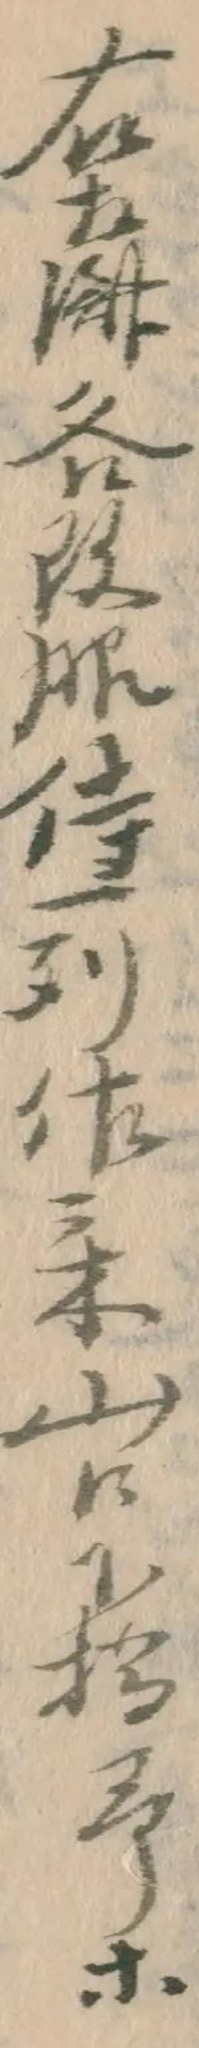右相済各改服侍一列佐々木山口下橋予等
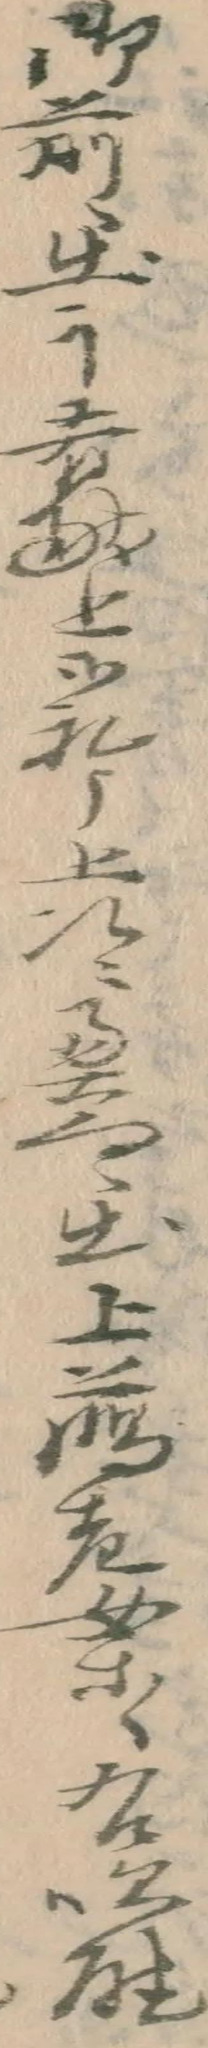御前ヘ出干肴献上御礼申上次ニ奥向へ出上臈老女等へ右吹聴
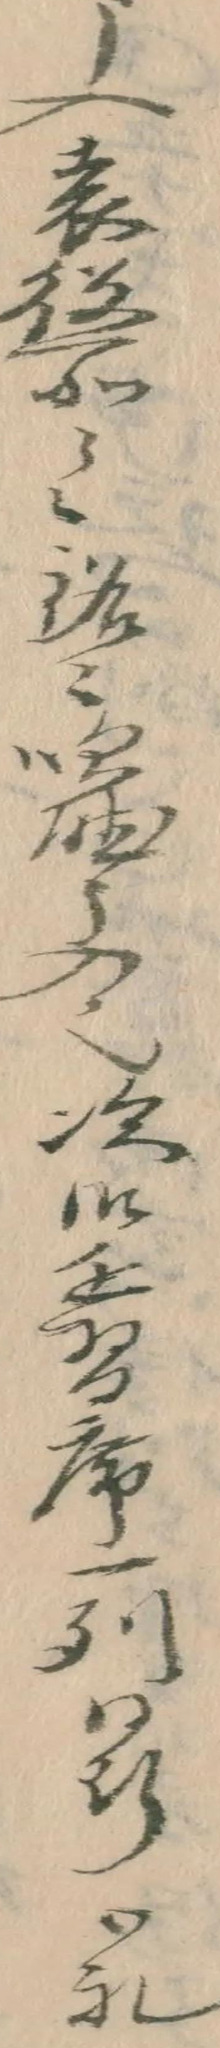申入表役所々御銘々吹聴申入也次御近習席一列同断御礼
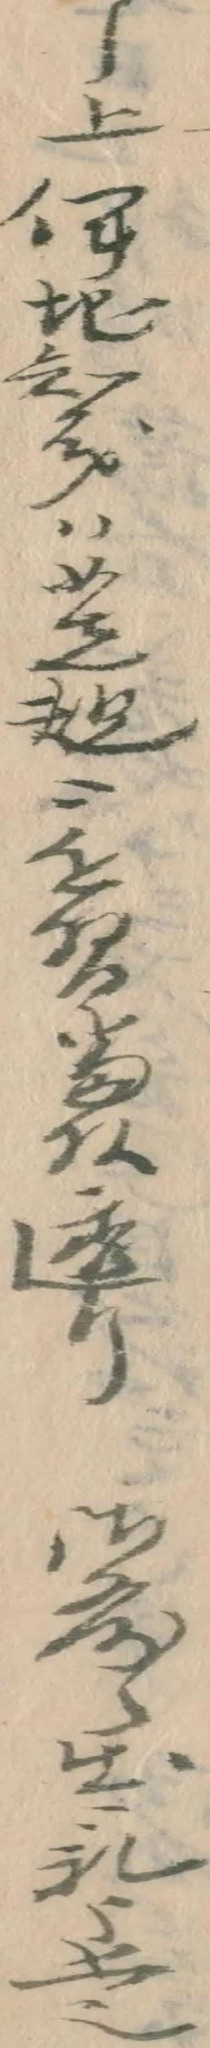申上伊地知義ハ如先規御近習番頭透引御蔵へ出御礼申上也
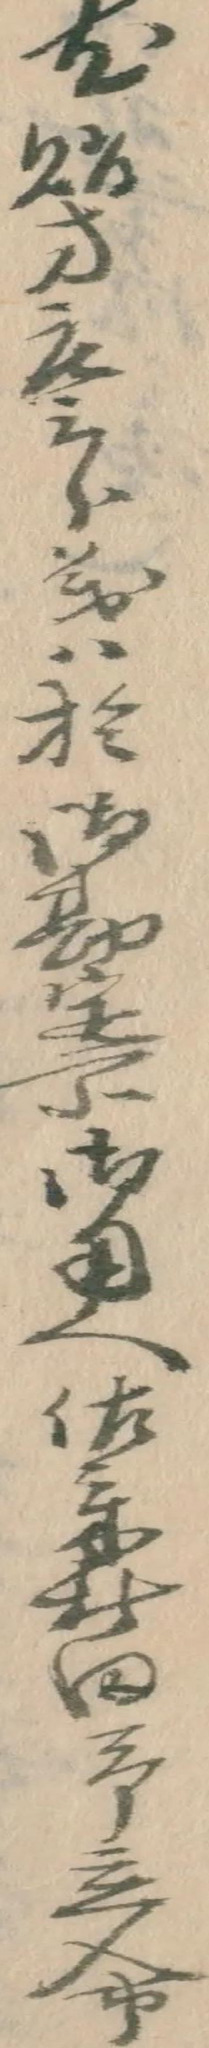尤賄方庄三郎義ハ於御勘定所御用人佐々木村田予三立入市
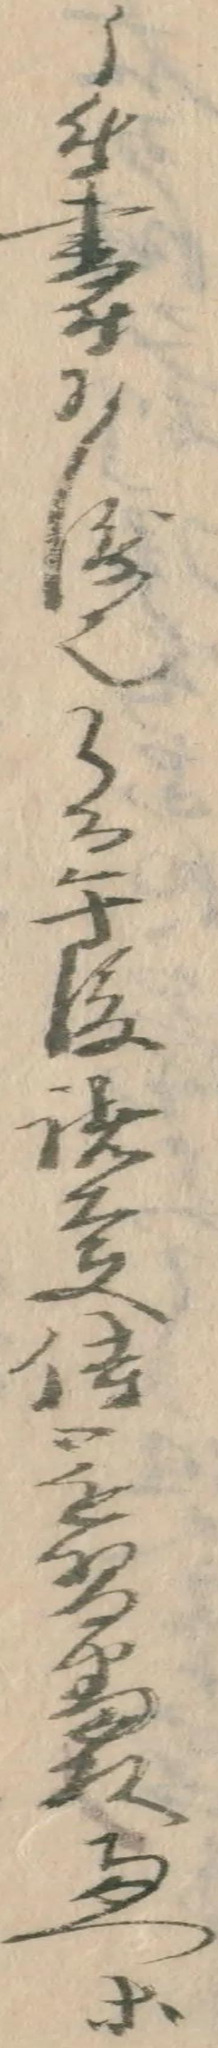申付書付書付相渡也了而午後諸大夫侍御近習番頭両人等
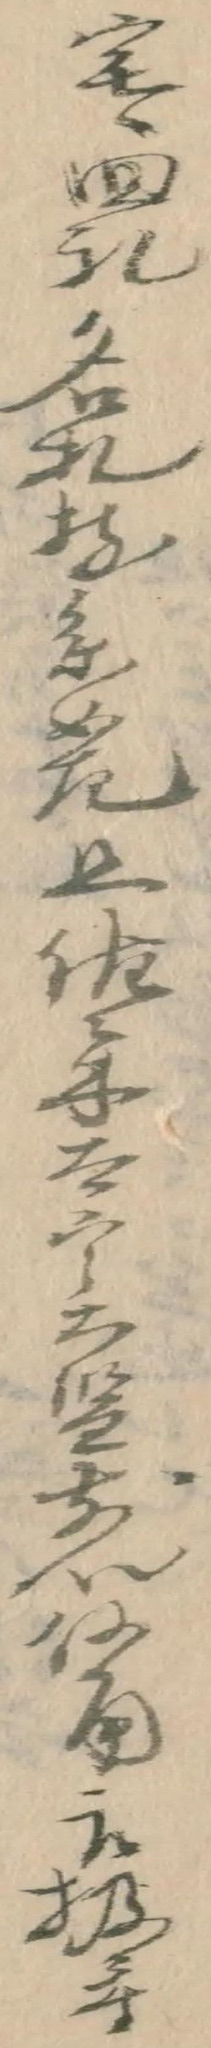定ヘ回礼名札持参如左且佐々木太宰大監前以何角取扱ニ付
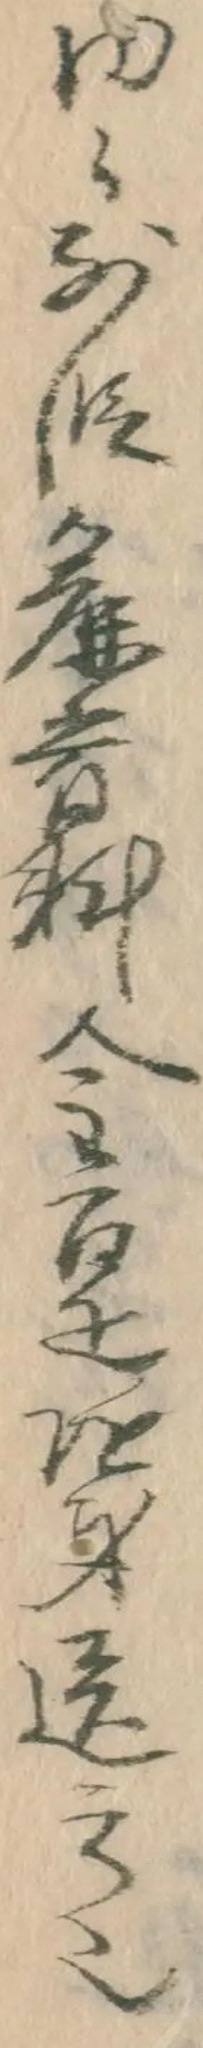内々別段麁肴料金百疋随身送之也

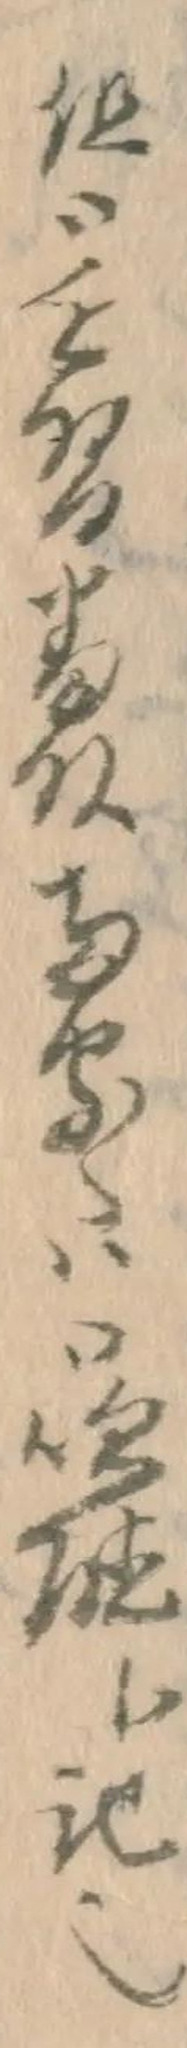但御近習番頭両處へハ御吹聴え記也
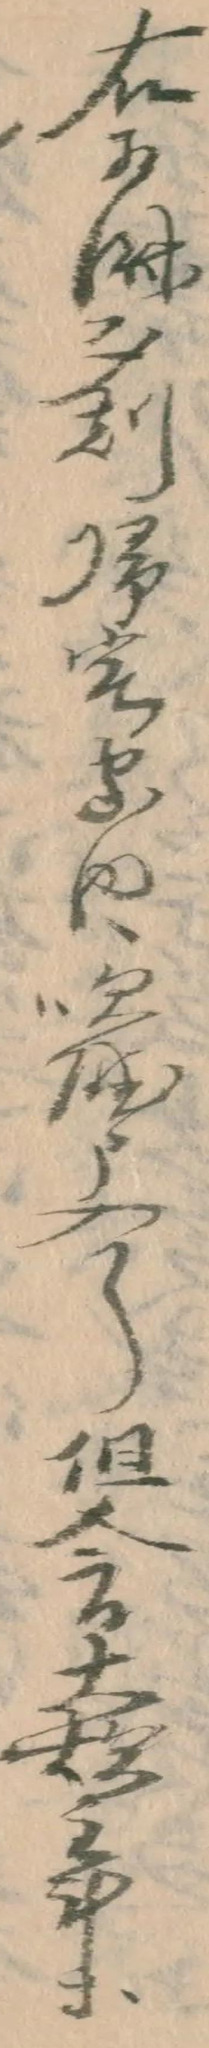右相済夕刻帰宅家内へ吹聴申入了但今日大炊主斗等
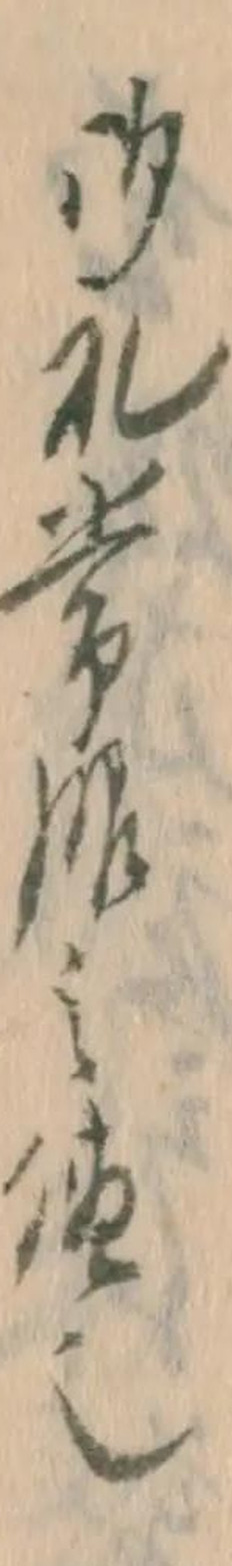御礼常服之侭也
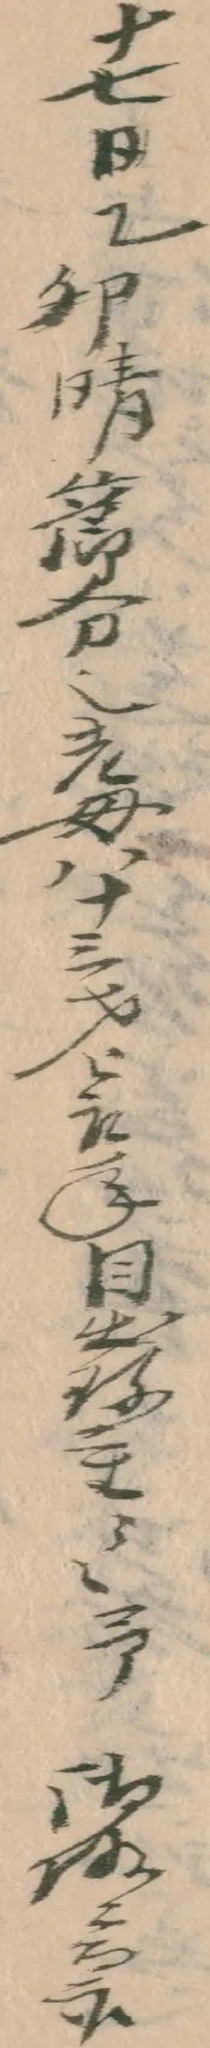十七日乙卯晴節分也老母八十三才被取年目出珍重々々予御殿ニ而取
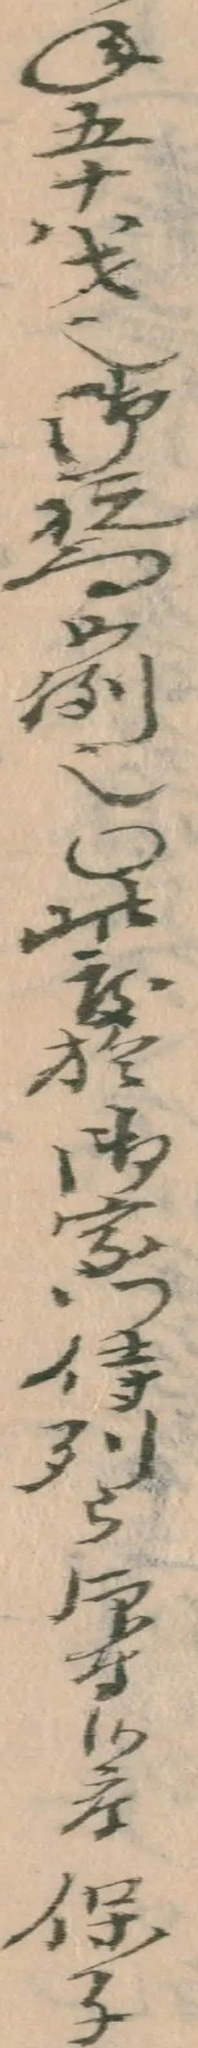年五十八才也御祝向如例也○此度於御家門侍列被仰付候ニ付保子
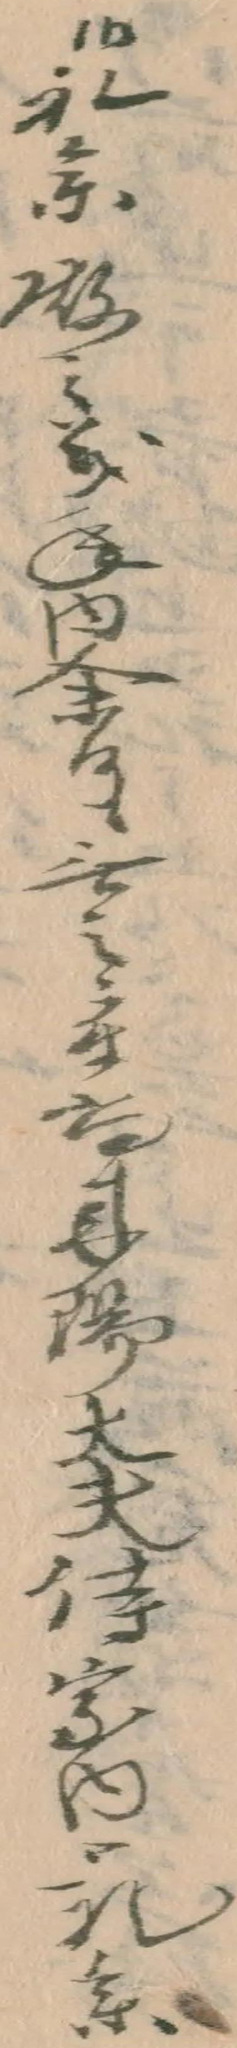御礼参殿之義年内余日も無之ニ付當来陽太夫侍家内御礼参
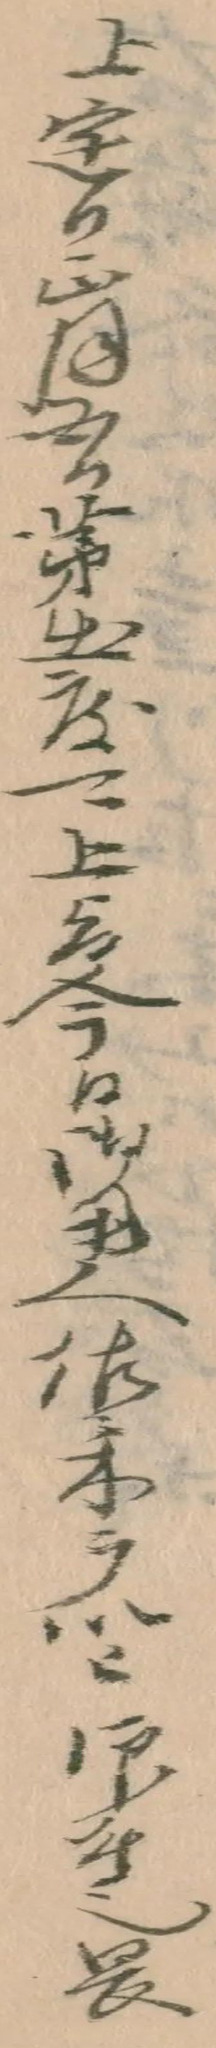上定日正月五日芽出度可上旨今日御用人佐々木ヲ以被仰付也畏
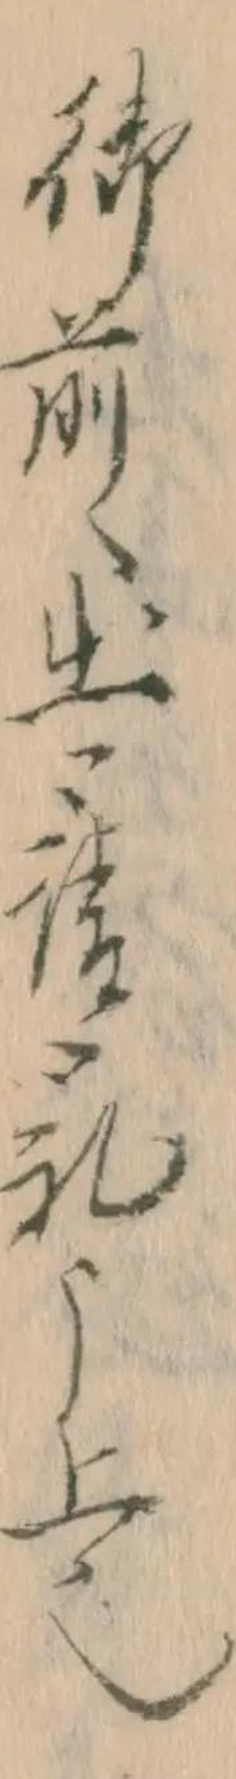御前へ出御請御礼申上也
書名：賀茂社記録. 第69冊
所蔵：国立国会図書館 National Diet Library, JAPAN
